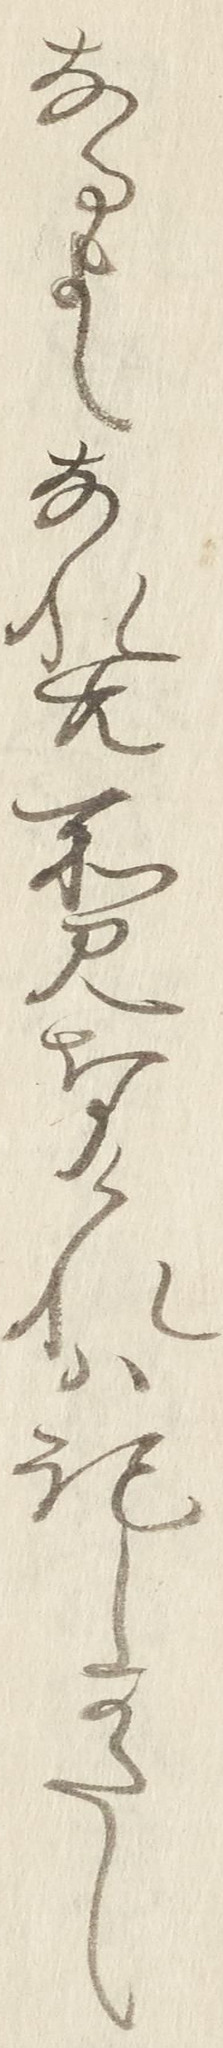なるよしなれ共所見なけれは記しかたし
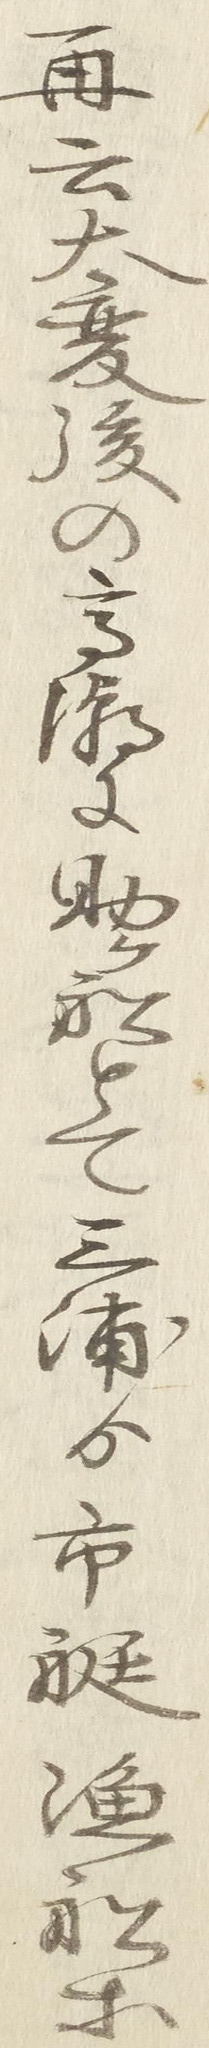再云大変後の高潮に助ケ船とて三浦より市艇漁船等
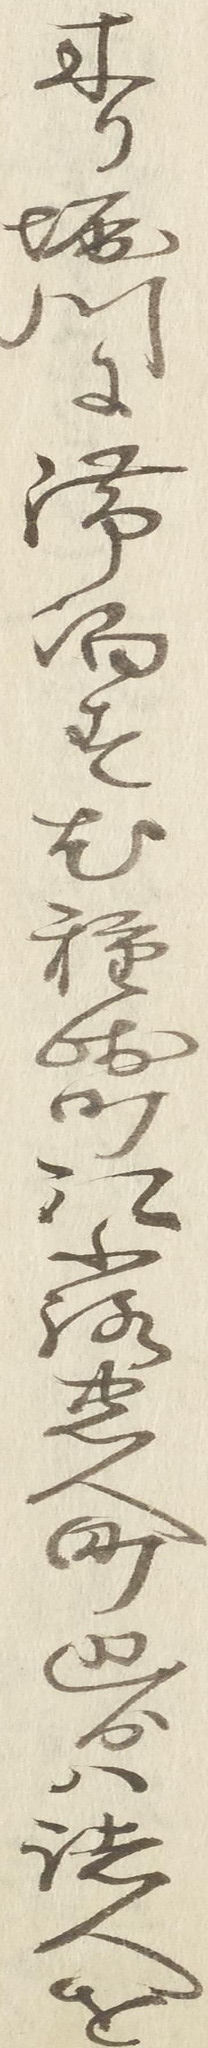来り堀川に停泊す尤種崎町弘小路農人町辺よりは諸人を
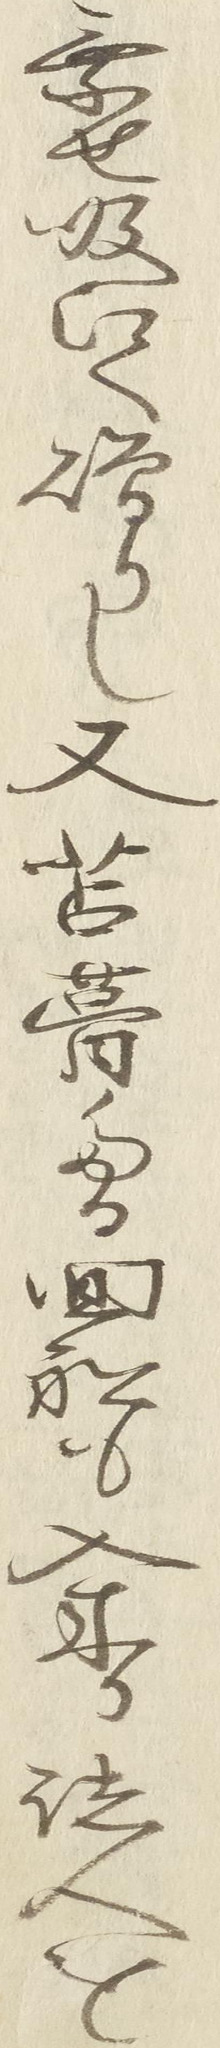乗せ吸江へ贈りし又苫葺たる廻船も入来り諸人を

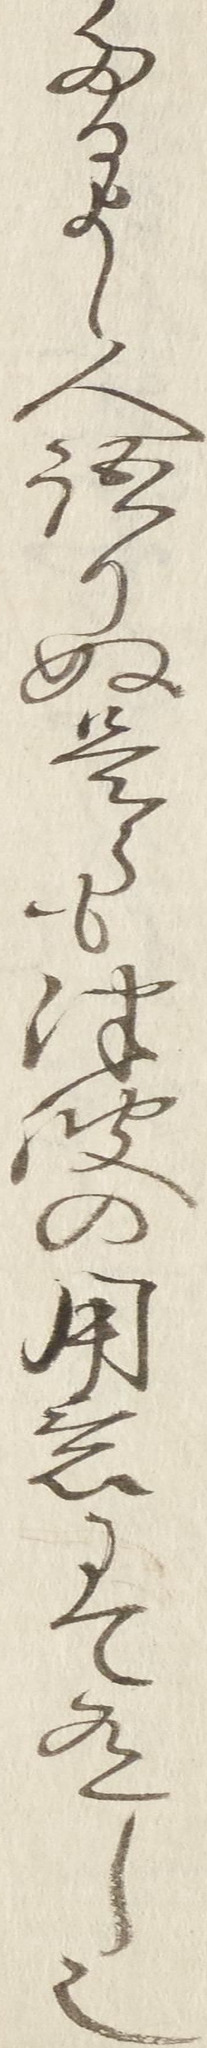たるよし人語りぬ是らも津波の用意にて有し也
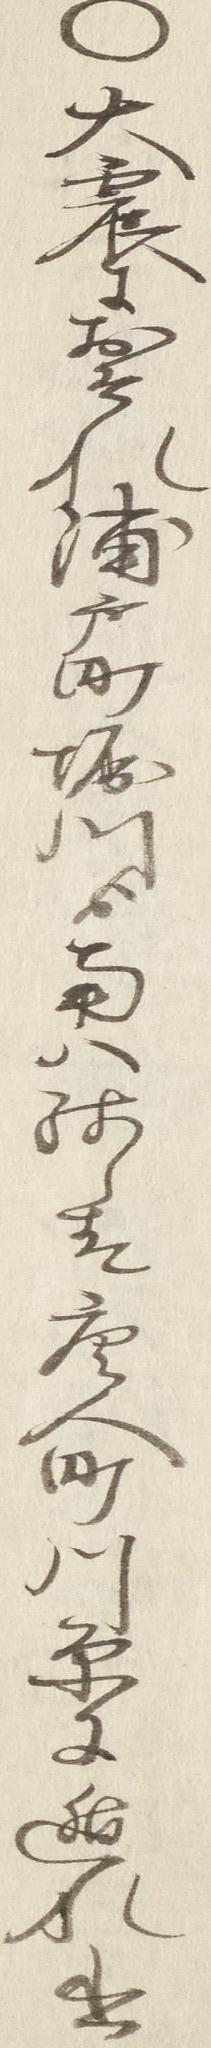〇大震におそれ浦戸町堀川より南は残らす唐人町川原に遁れ出
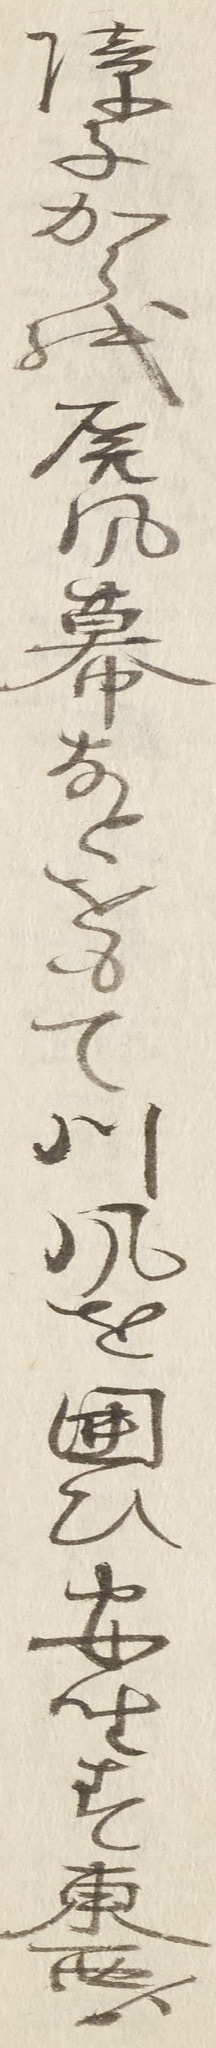障子から紙屏風幕などをもて川風を囲ひ安座す東西より
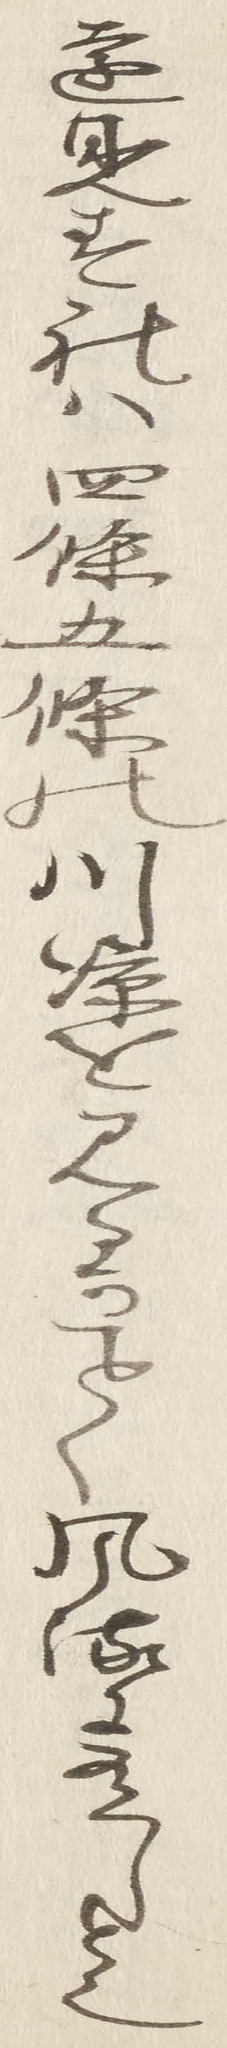遠見すれは四条五条の川涼を見るかことく風流に有しと也
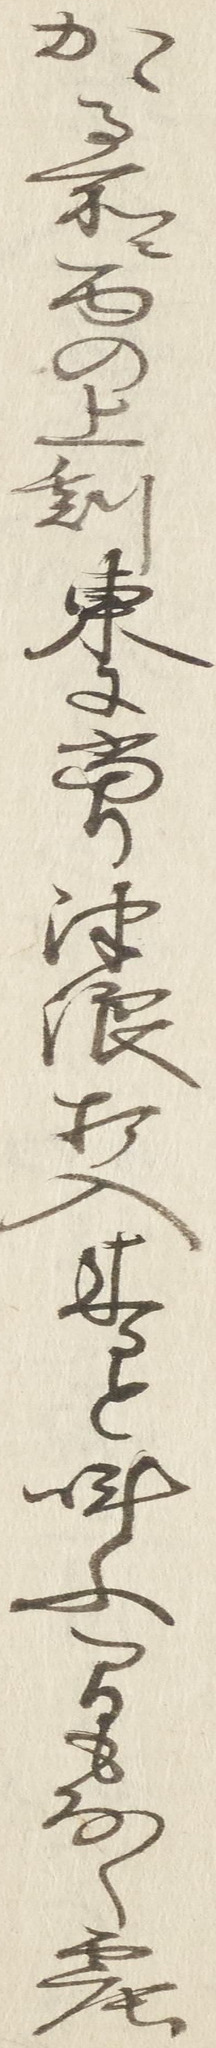かゝる所に酉の上刻東に当り津浪打入来ると叫ぶ間もなく震
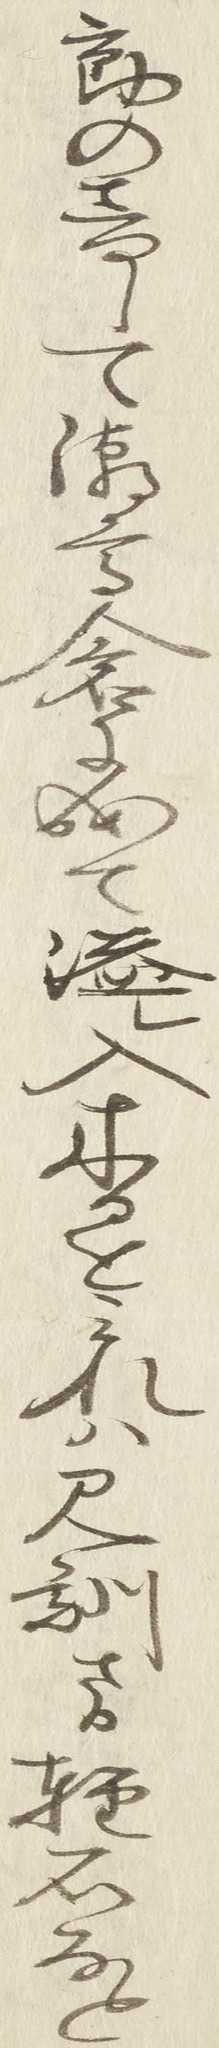動の音して潮高倉に成て溢入来るとりみれは見馴さる軽石なと
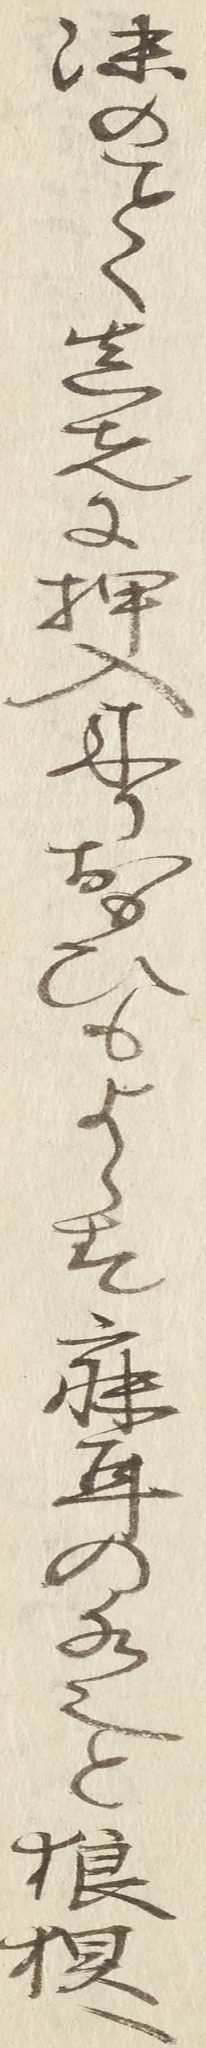沫のことく真先に押入来りおもひもらよす寝耳に水と狼狽し
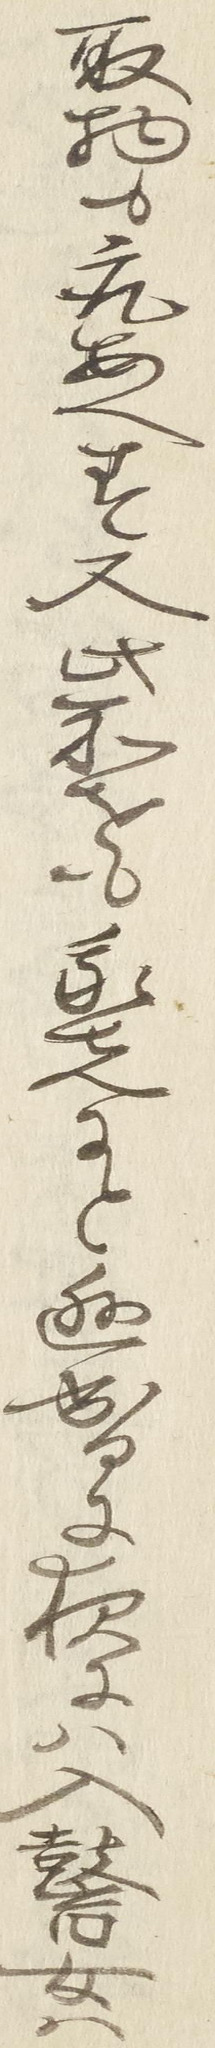取物も取あへす又此所をも我先にと逃出るに夜には入瞽女は
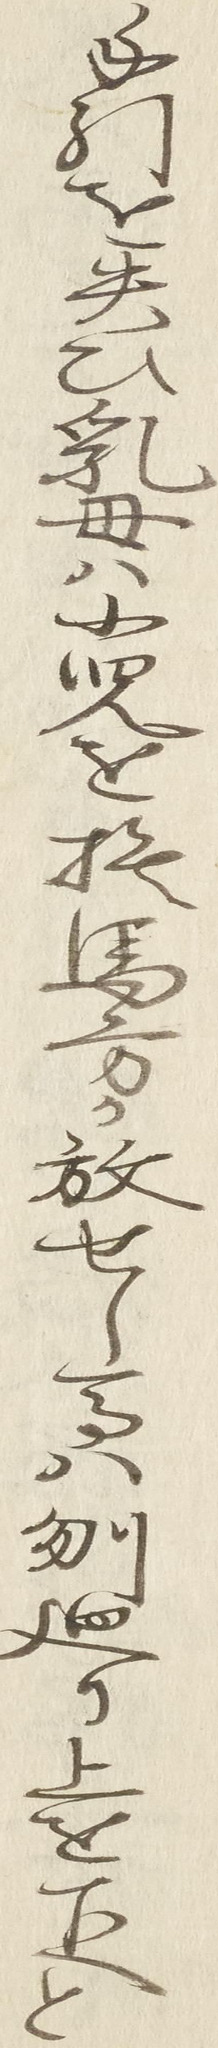手引を失ひ乳母は小児を捨馬方か放せし馬は刎廻り上を下へと
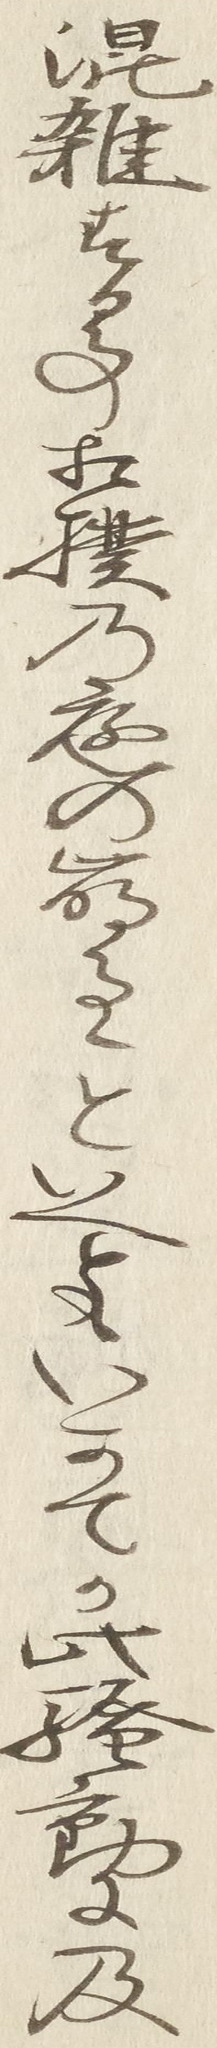混雑する事相撲の庭の崩るゝといへともいかてか此騒動に及
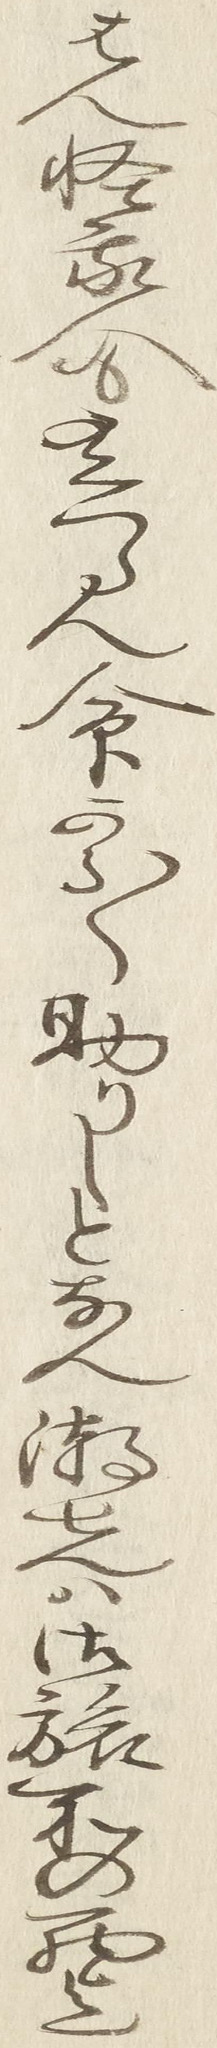はん怪我人も有つらん命から〳〵助りしとなん潮先は御旅所の西迄
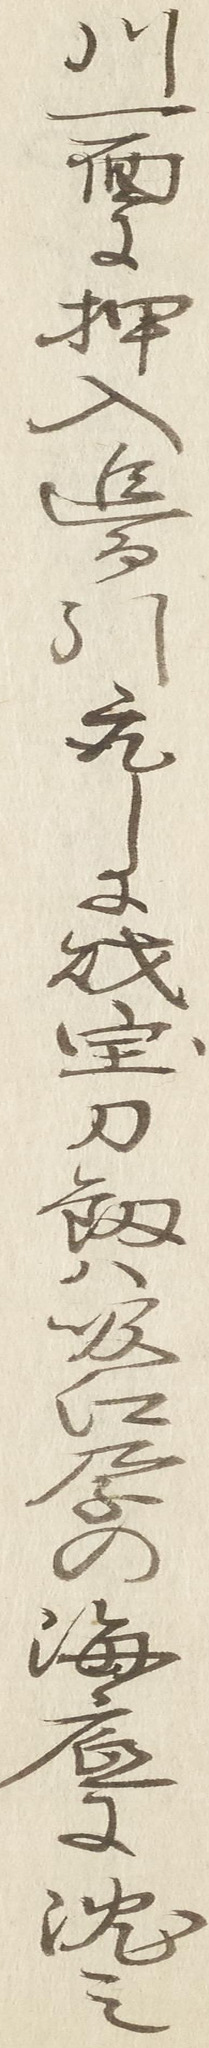川一面に押入追て引取しに財宝刀剣は吸江孕の海底に沈み
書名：地震記　上
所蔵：東京大学地震研究所図書室 Earthquake Research Institute Library, The University of Tokyo, JAPAN
